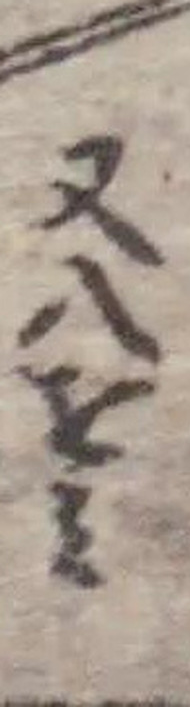又八をみ
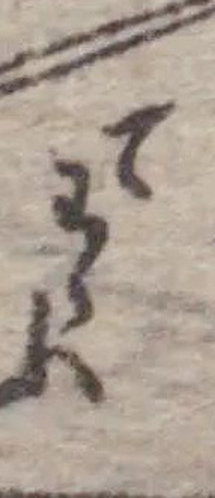わらふ
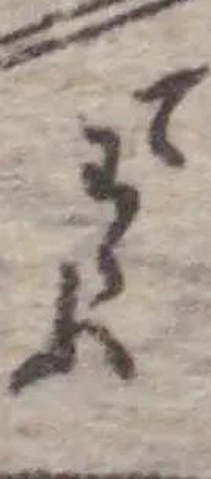わらふ

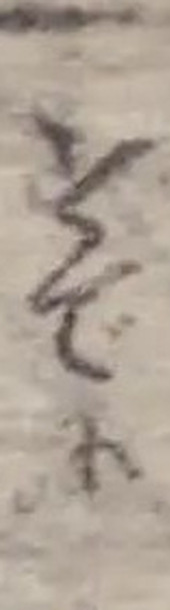すでに
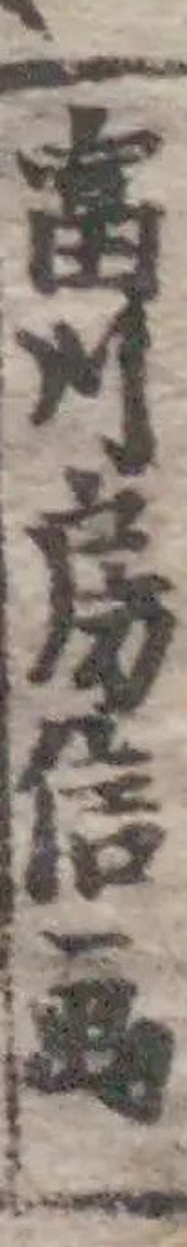富川房信画
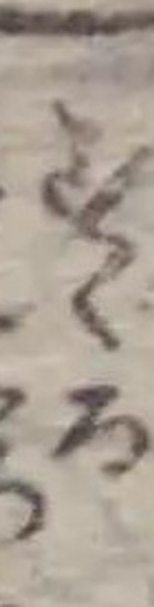すぐる
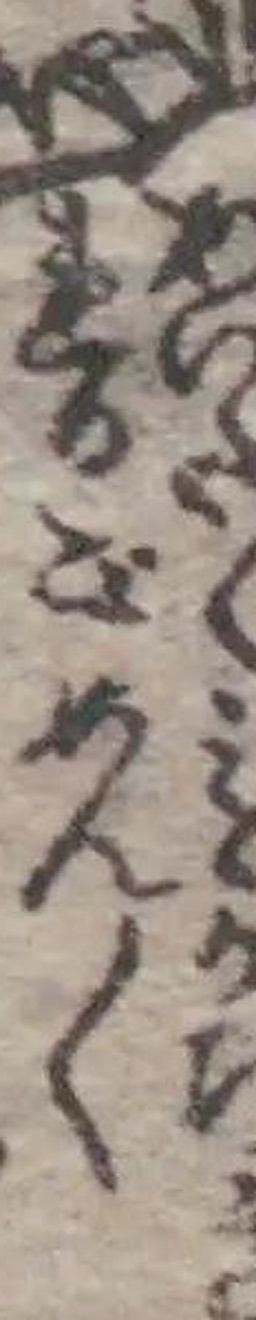れるごめん〳〵
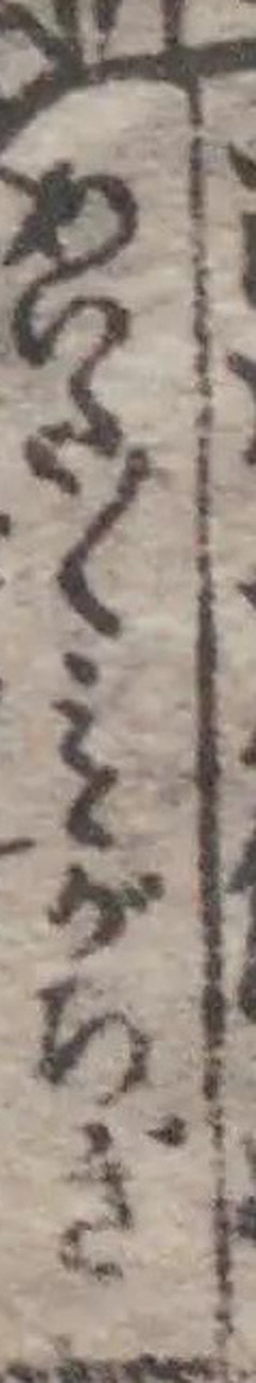あいた〳〵みゝがちぎ
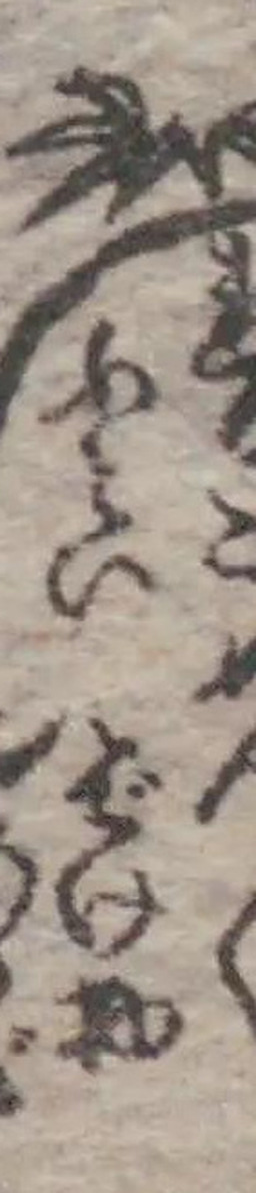ふといばけ物
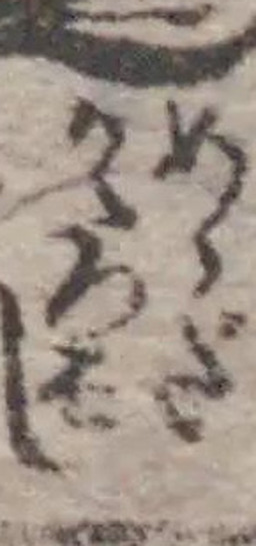かたつはし
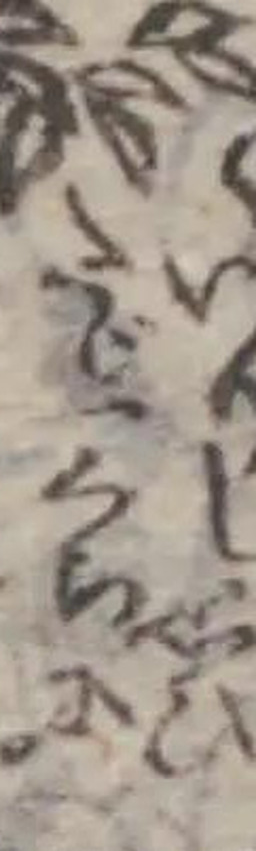たゞ一くちに
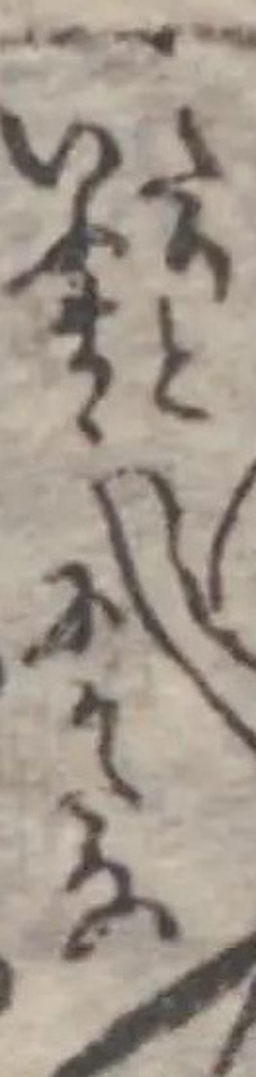いふまゝにかたな
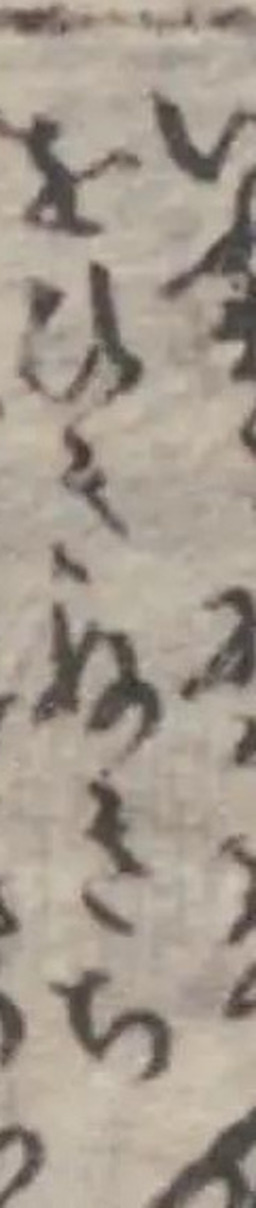をひきぬきち
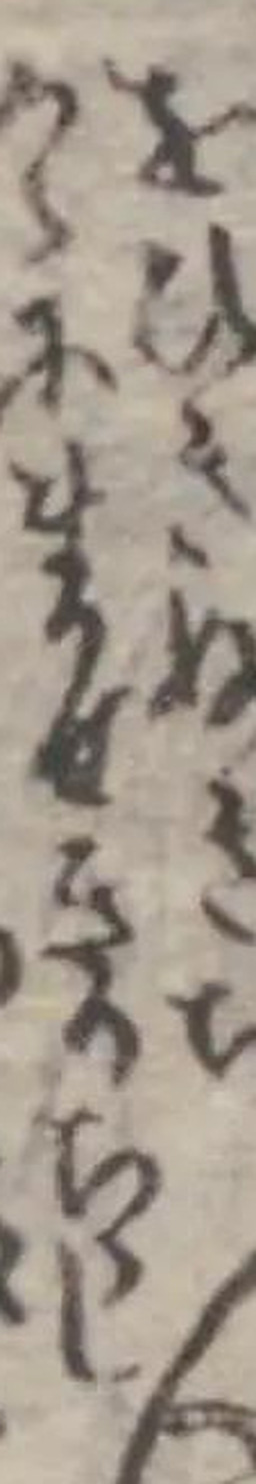からにまかせきりちらし
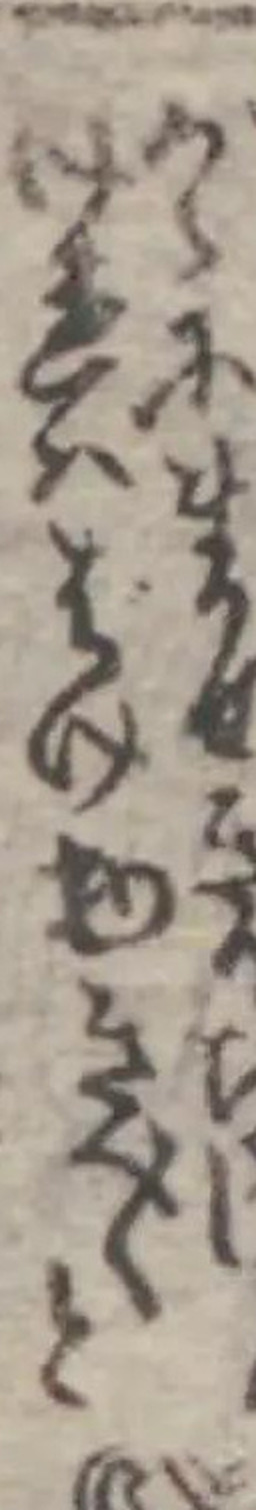けれはばけ物きへ〳〵
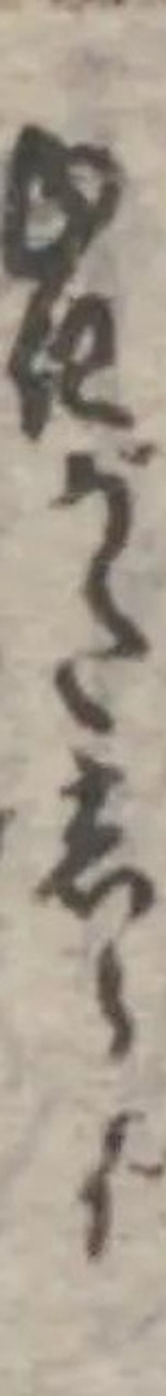ゆきがたしらず
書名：鎌田又八 2巻
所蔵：国立国会図書館 National Diet Library, JAPAN
